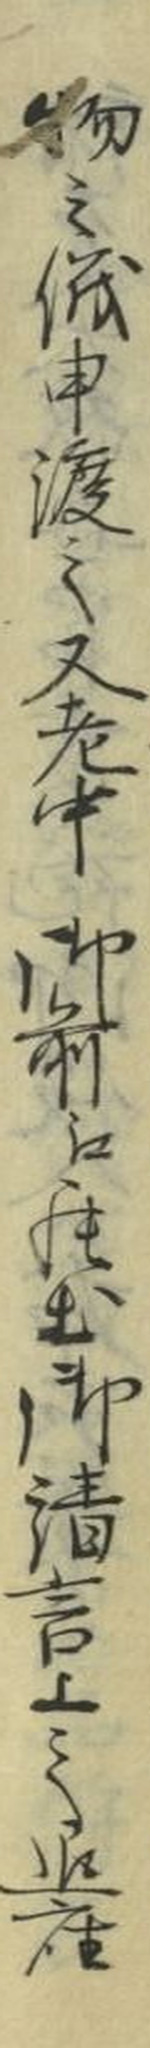物之儀申渡之又老中御前え罷出御請言上之退座
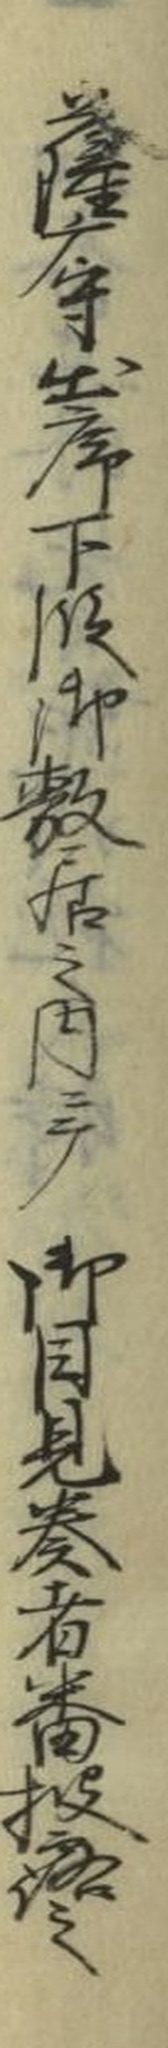薩摩守出席下段御敷居之内にて御目見奏者番披露之
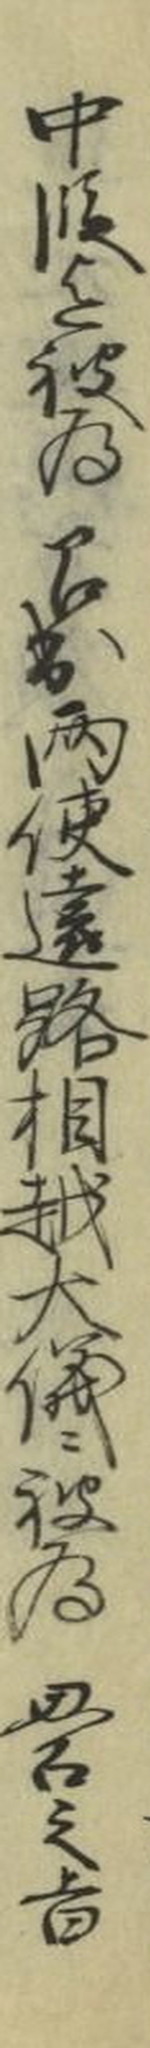中段迄被為召出両使遠路相越大儀に被為思召之旨
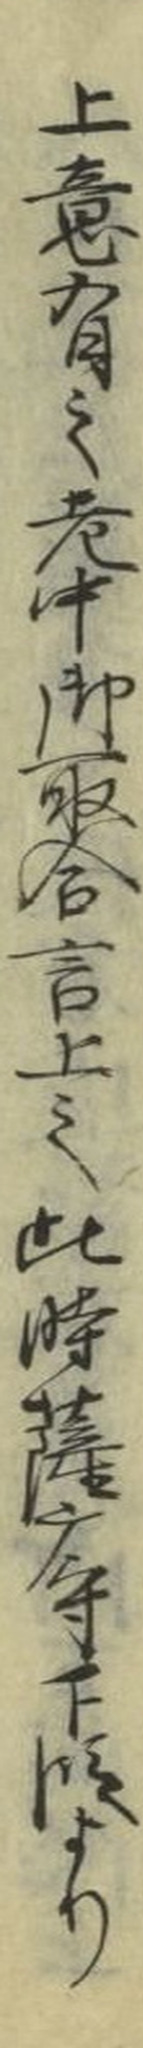上意有之老中御取合言上之此時薩摩守下段より
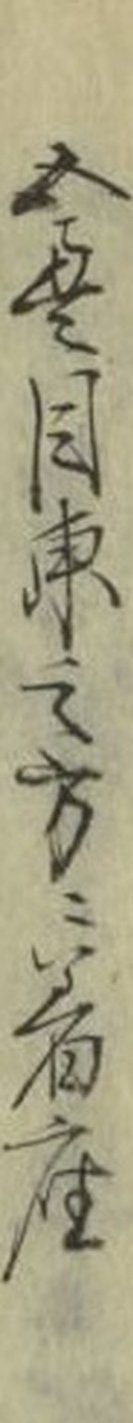五畳目東之方に着座
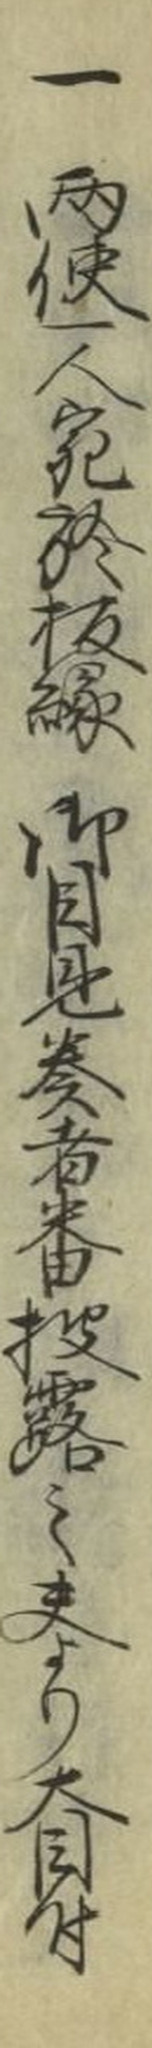一両使一人宛於板縁御目見奏者番披露之夫より大目付
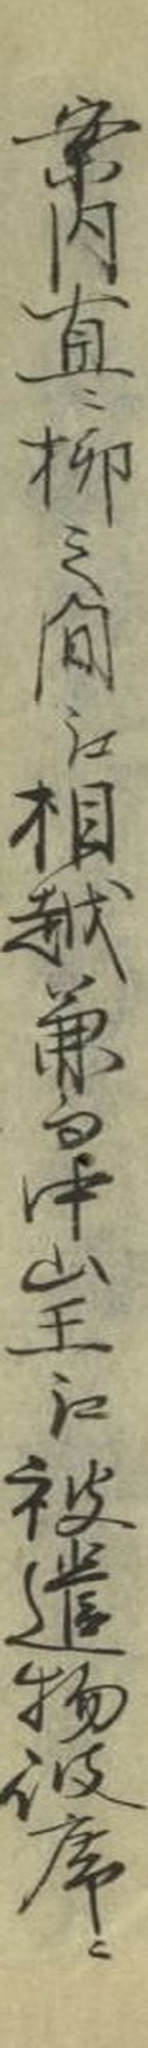案内直に柳之間え相越兼而山中王え被遣物彼席に
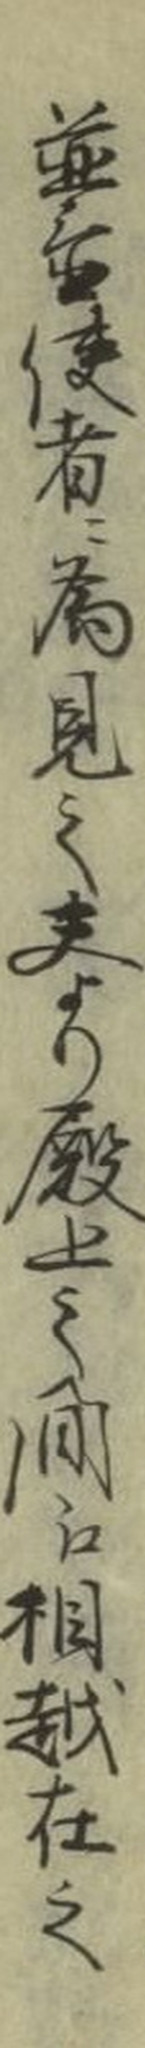並置使者に為見之夫より殿上之間え相越在之
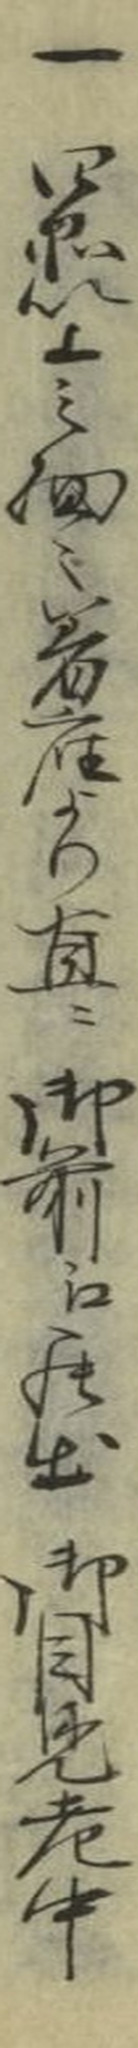一四品以上之面々着座より直に御前え罷出御目見老中
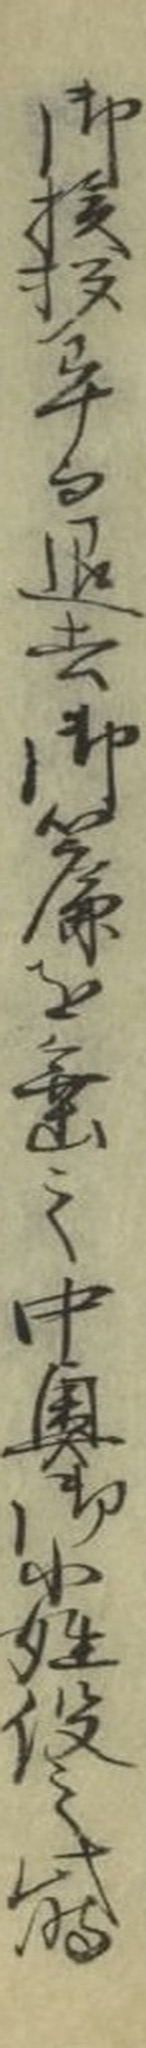御挨拶畢而退去御簾を垂之中奥御小姓役之此時
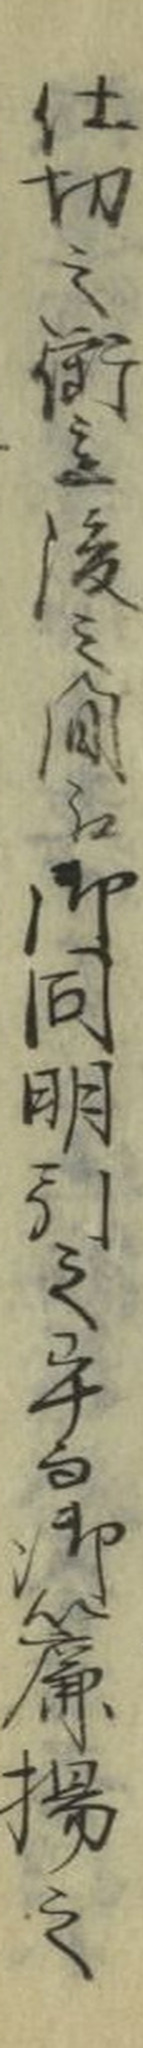仕切之衝立後之間え御同朋引之畢而御簾揚之
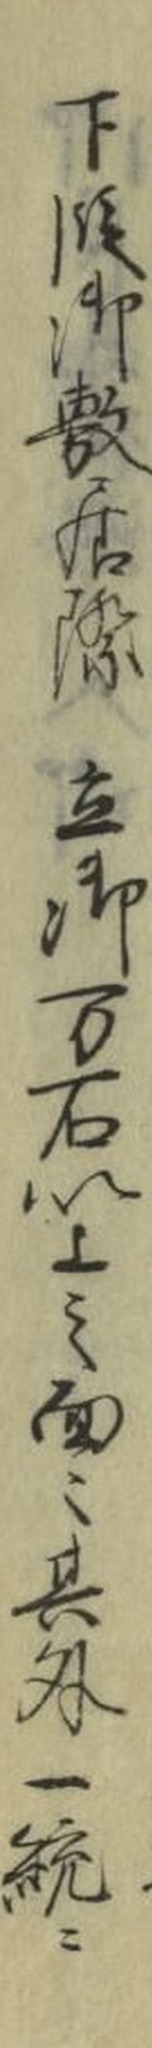下段御敷居際立御万石以上之面々其外一統に

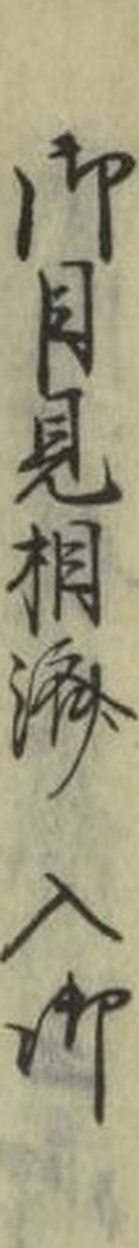御目見相済入御
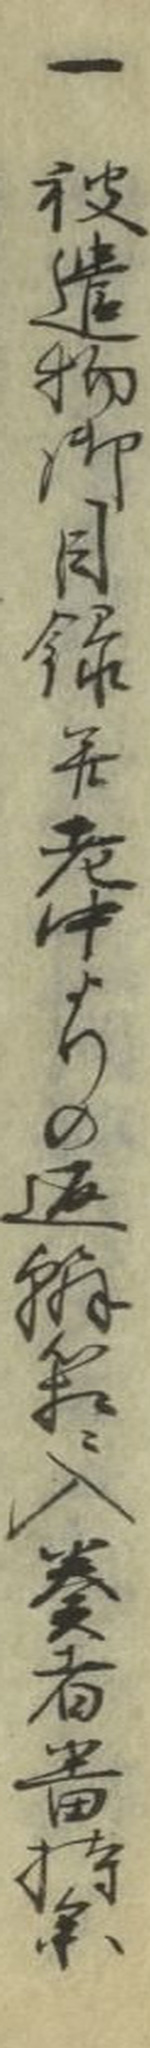一被遣物御目録幷老中よりの返翰箱に入奏者番持参
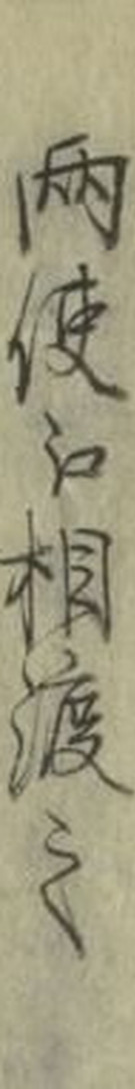両使え相渡之
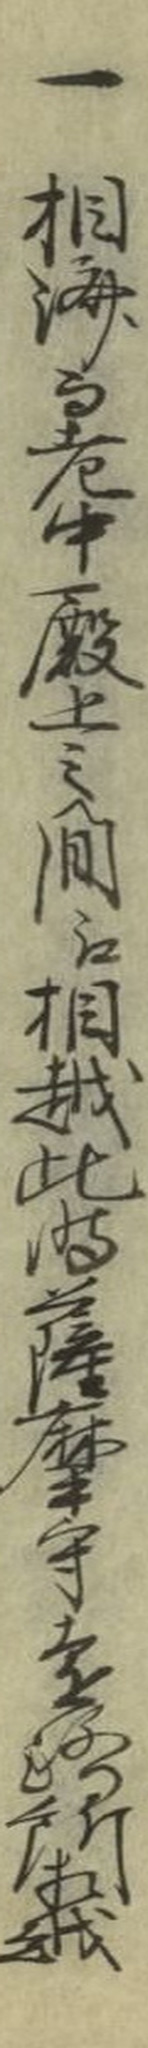一相済而老中殿上之間え相越此時薩摩守遠路所相越
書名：宝永七庚寅年琉球国来聘使日記
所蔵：University of the Ryukyus Library
